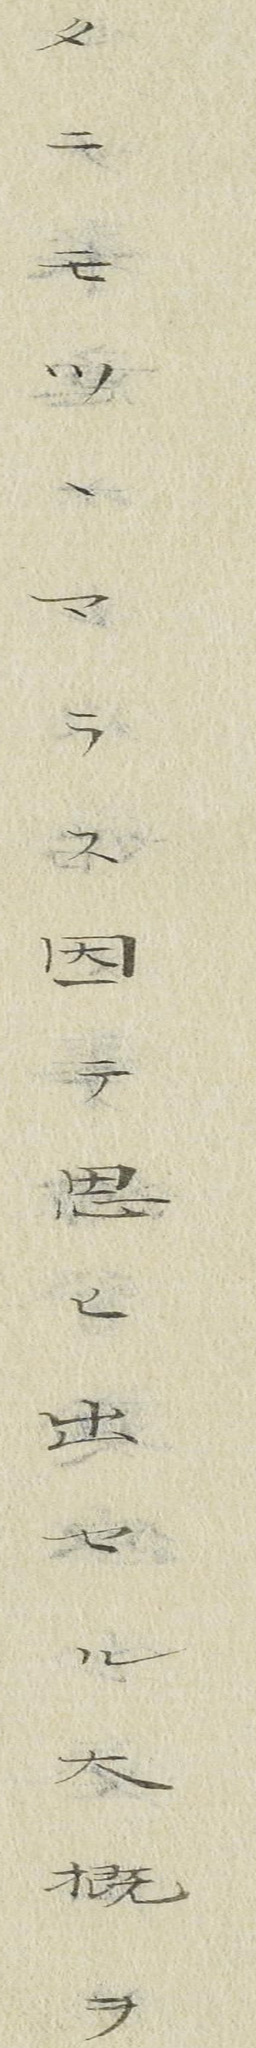タニモツヽマラス因テ出セル大概ヲ
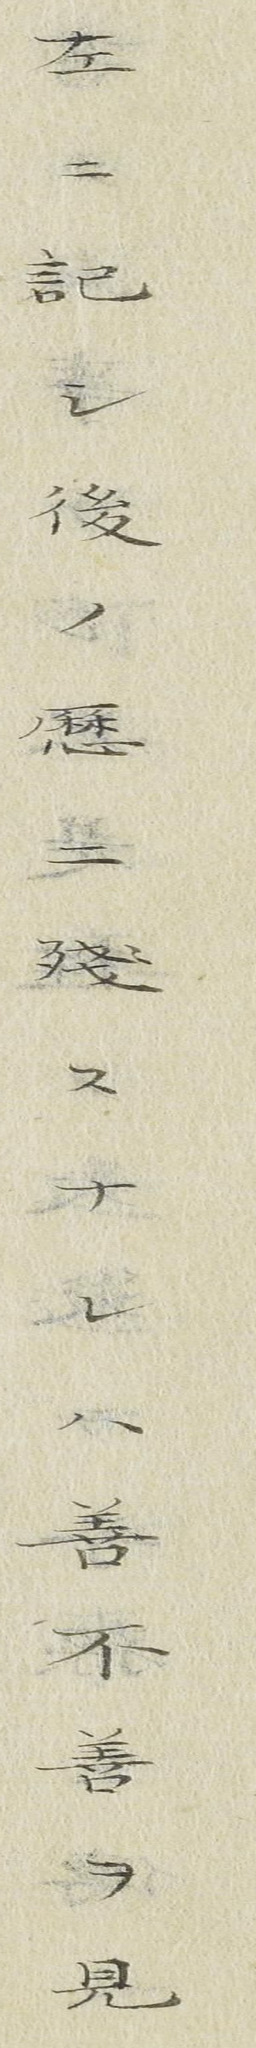左ニ記シ後ノ歴に残スナレハ善不善ヲ見
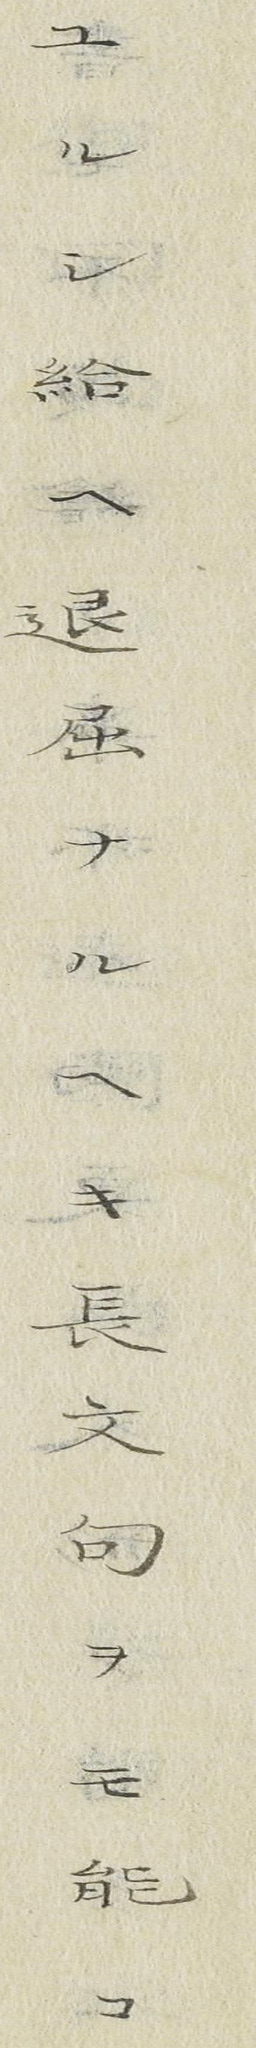ユルシ給へ退屈ナルヘキ長文句ヲモ能コ
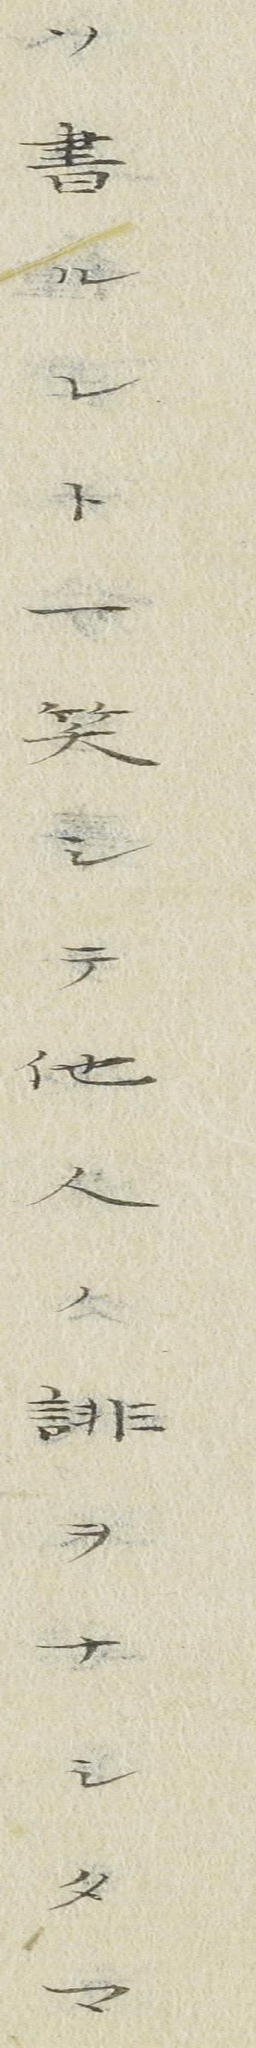ソ書ルレト一笑シテ他人ノ誹ヲナシタマ
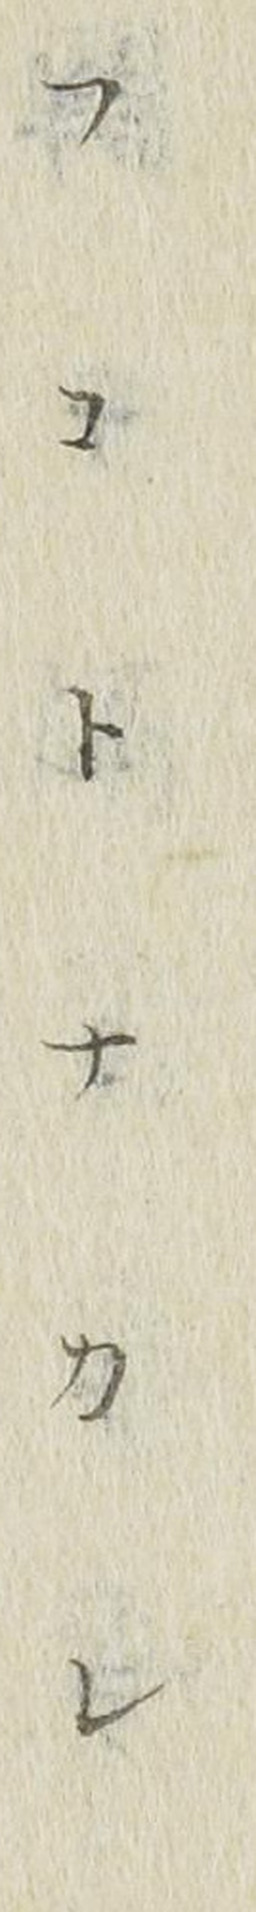フコトナカレ
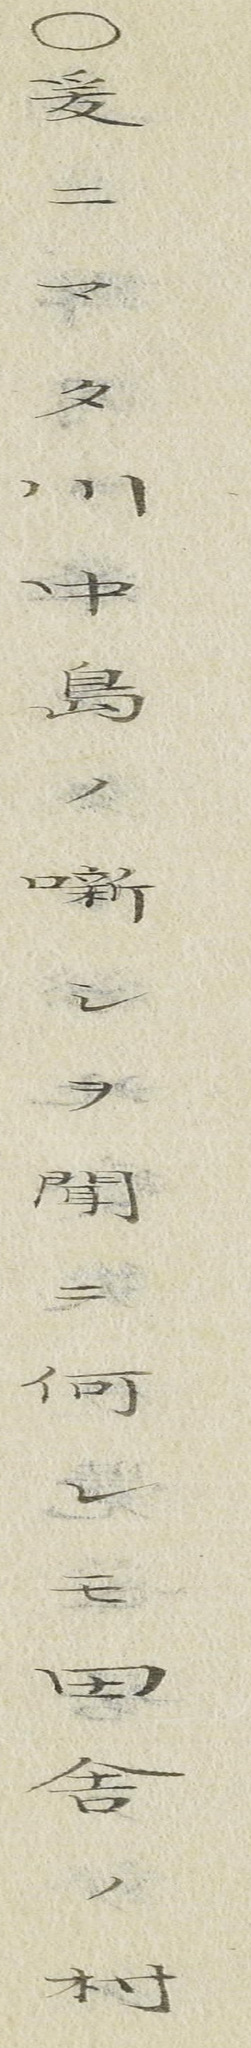○爰ニマタ川中島ノ噺シヲ聞ニ何レモ田舎ノ村
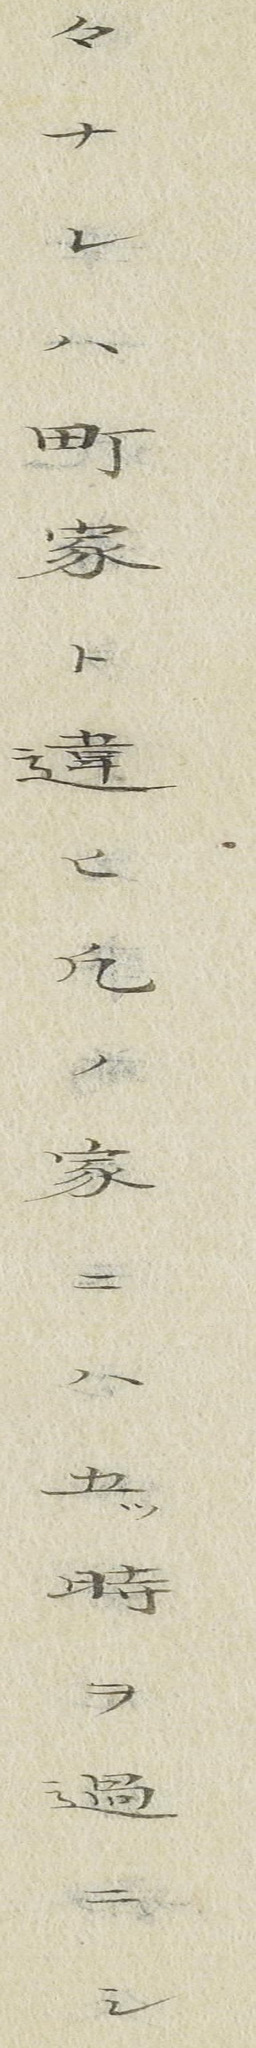々ナレハ町家ト違ヒ凡ノ家ニハ五ツ時ヲ過ニシ
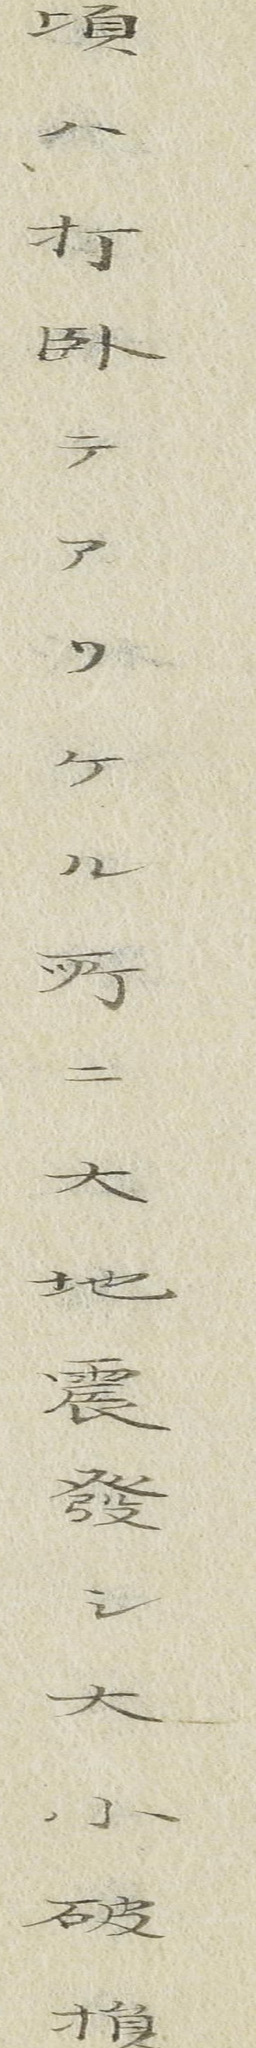頃ハ打臥テアリケル所ニ大地震発シ大小破損
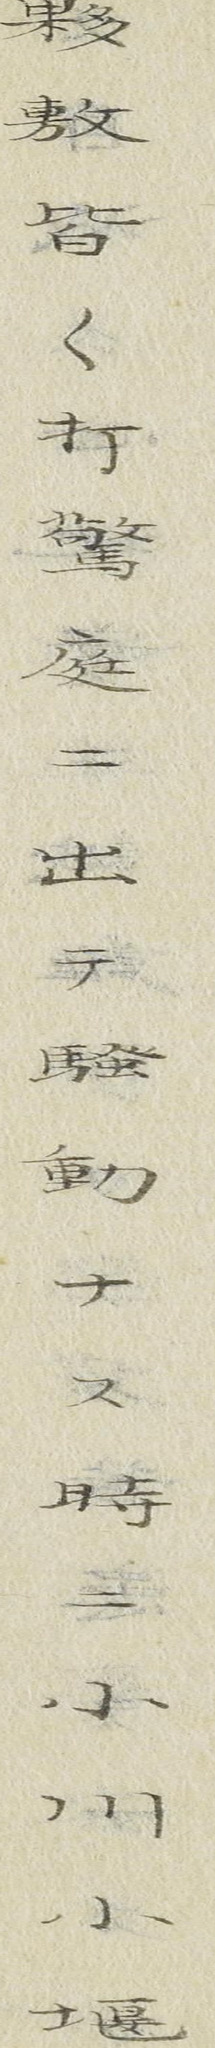夥敷皆〱打驚庭ニ出テ発動ナス時ニ小川小堰
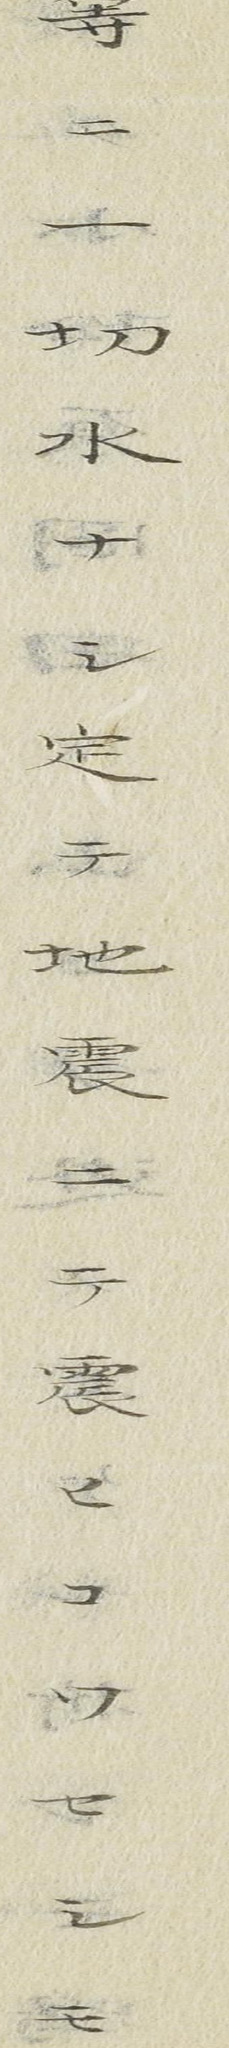等ニ一切水ナシ定テ地震ニテ震ヒコワセシモ
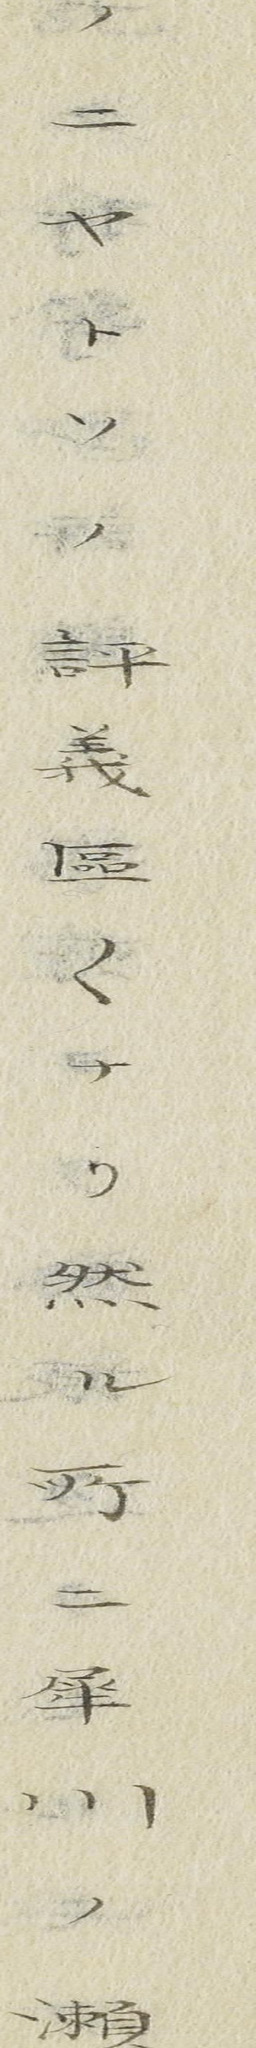ノニヤトソノ評議区々チク然ル所ニ犀川ノ瀬
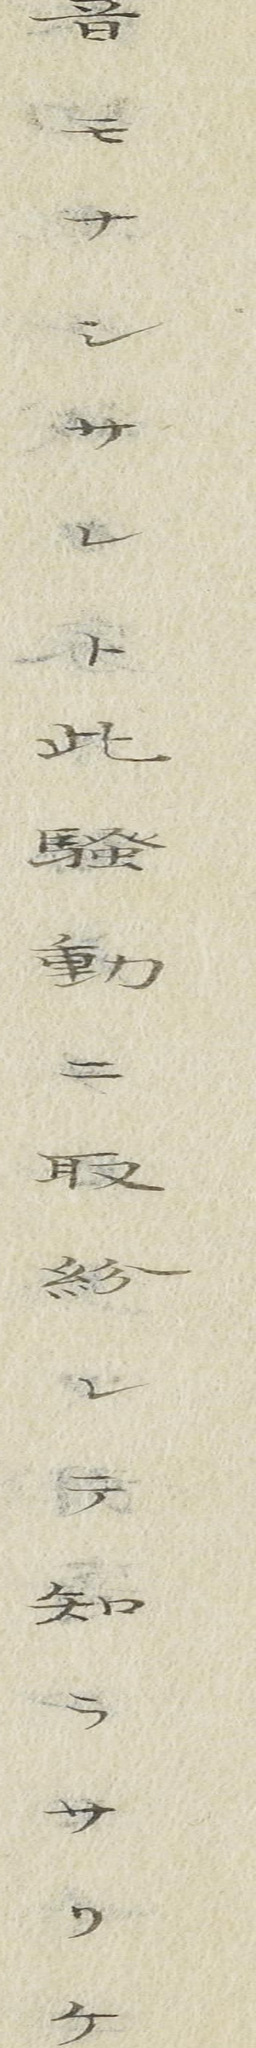音モナシサレト此騒動ニ取紛レテ知ラサリケ
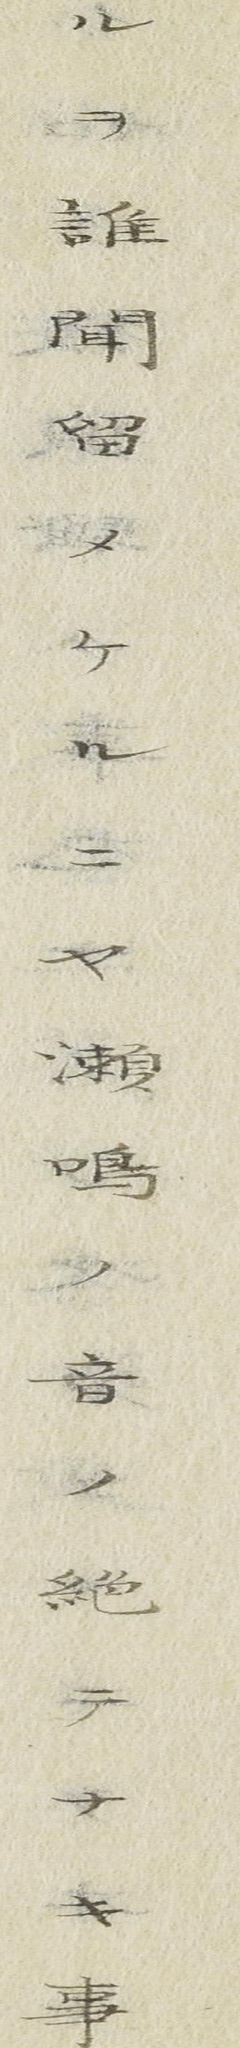ルヲ誰聞留メケルニヤ瀬鳴ノ音ノ絶テナキ事
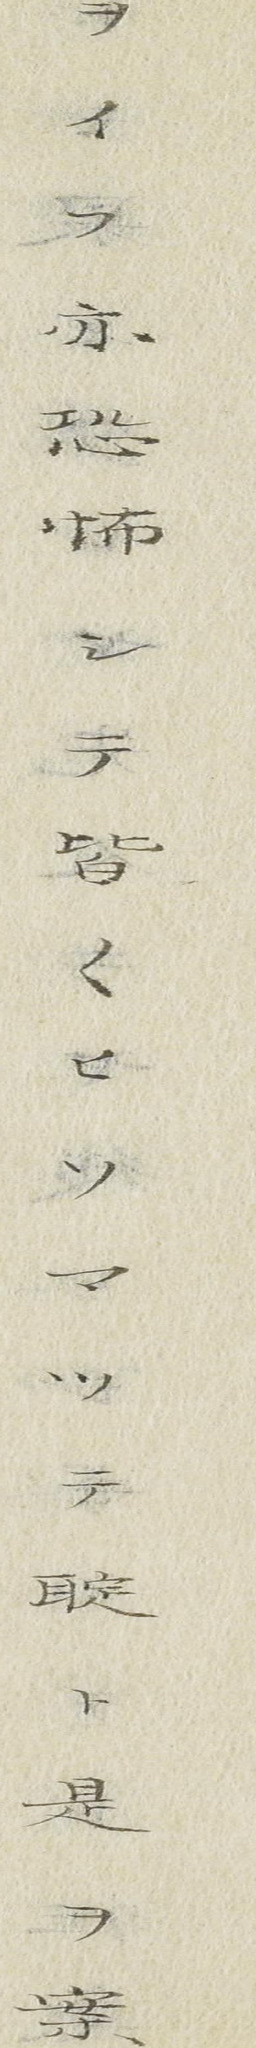ヲイフ亦恐怖ニテ皆〱ヒソマツテ聢ト是ヲ案
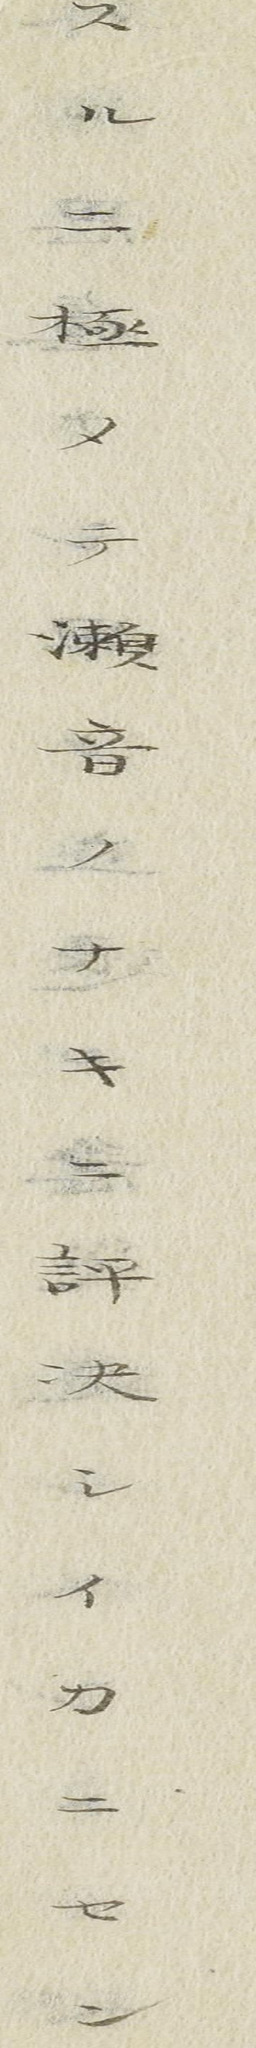スルニ極メテ瀬音ノナキニ評決シイカニセン
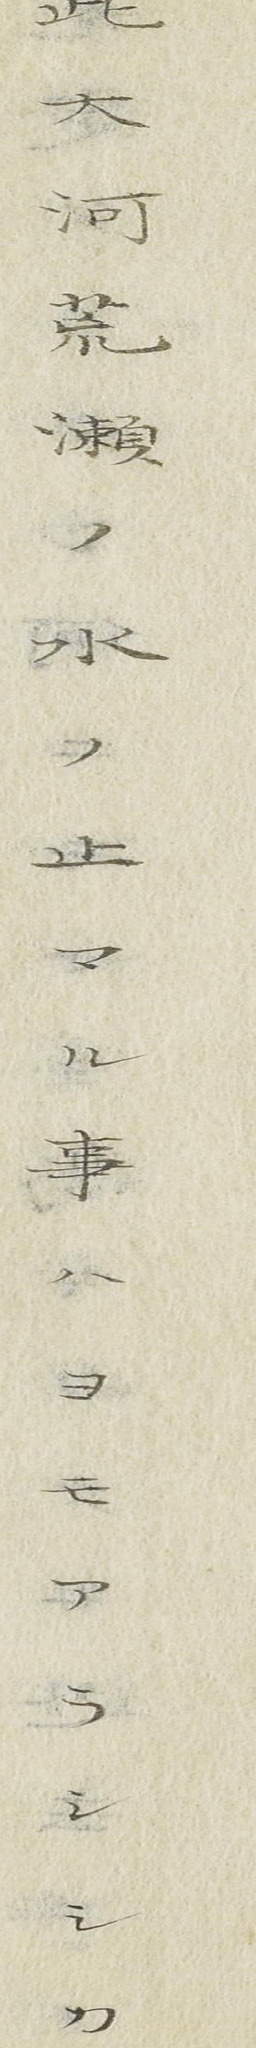此大河荒瀬ノ水ノ止マル事ハヨモアラシシカ
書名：地災撮要　地震之部　巻ノ二
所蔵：東京大学地震研究所図書室 Earthquake Research Institute Library, The University of Tokyo, JAPAN
